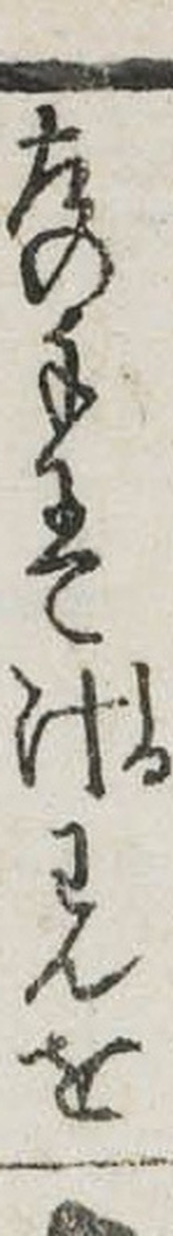左の手にて汁わんを
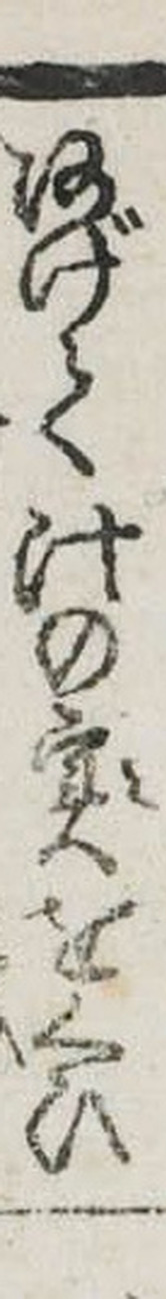あげて汁の実をくひ
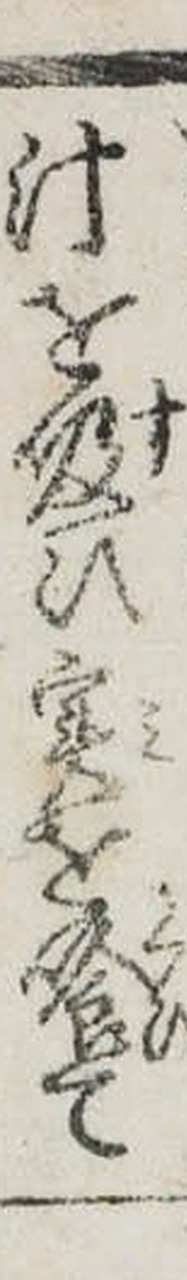汁を吸ひ実を喰て
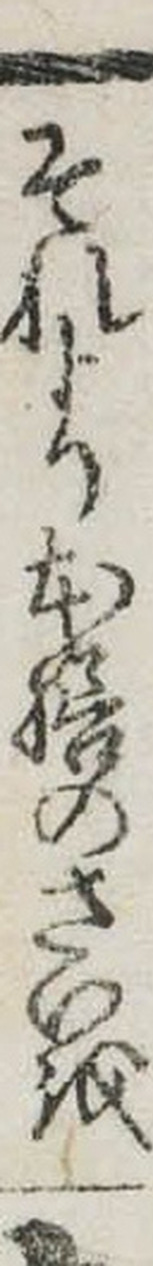それより本膳のさいを
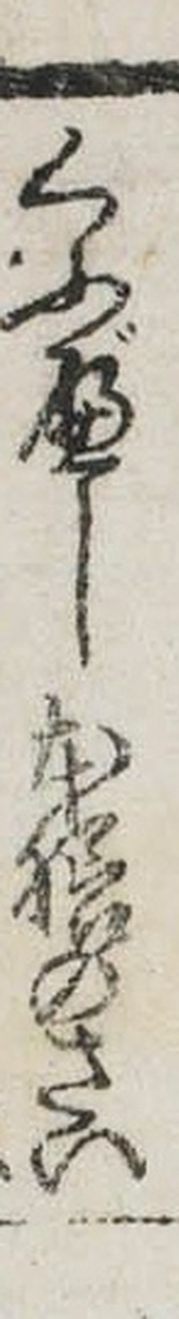くふべし本膳のさい
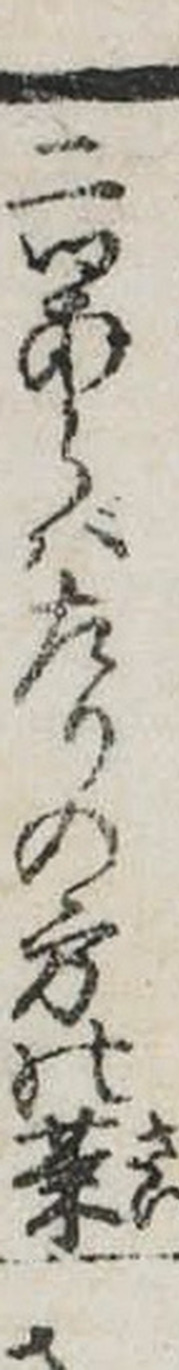二ッあらば左りの方の菜
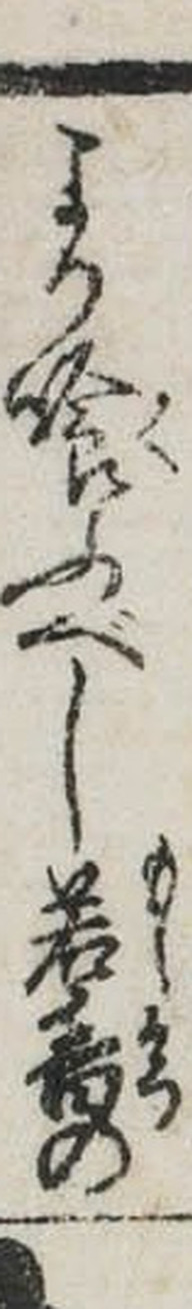より喰ふべし若香の
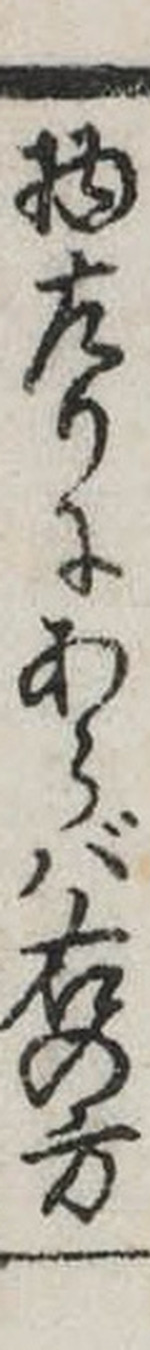物左りにあらば右の方
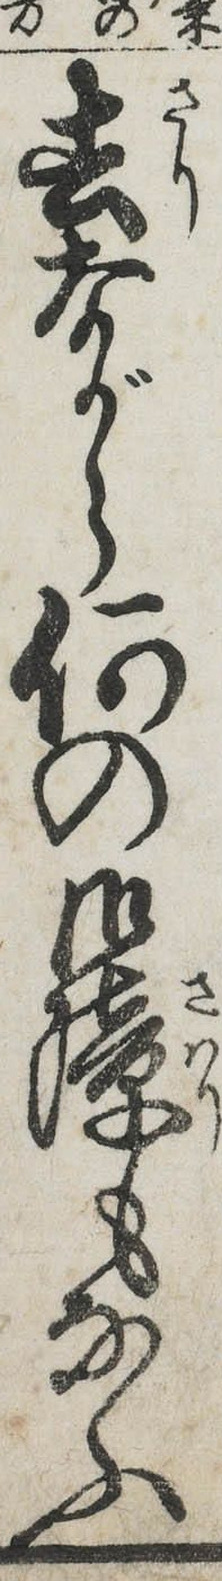去ながら何の御障もなふ
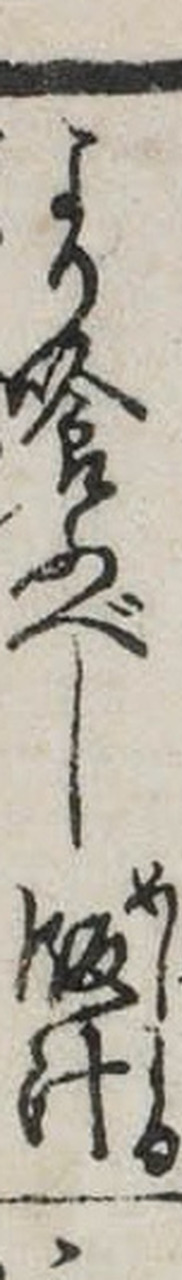より喰ふべし飯汁
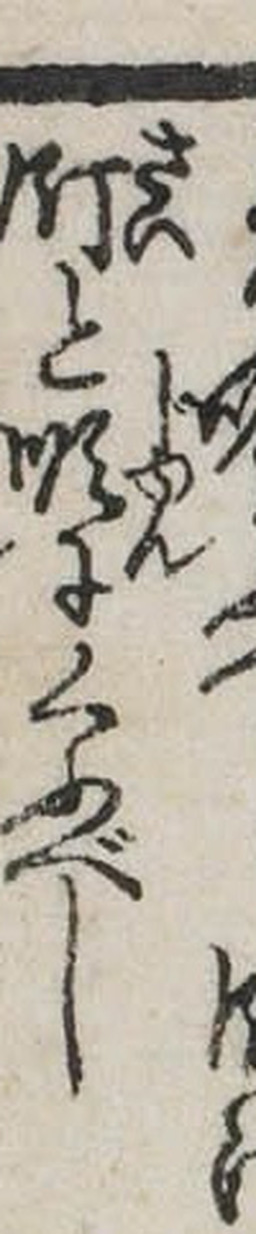飣と順にくふべし
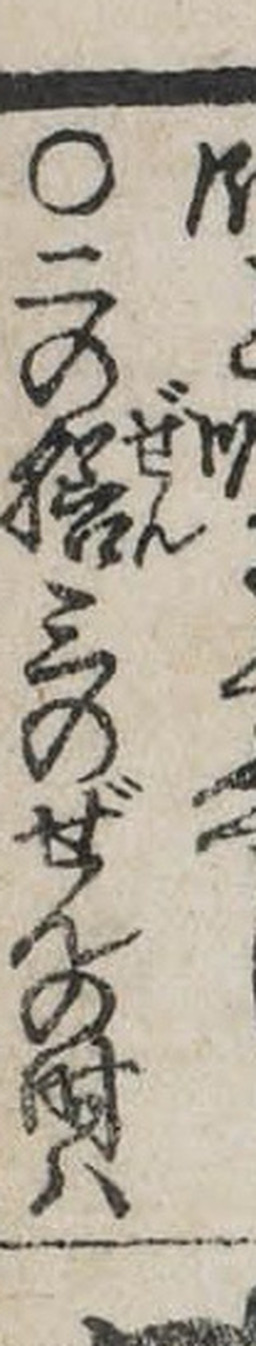○二の膳三のぜんの時は

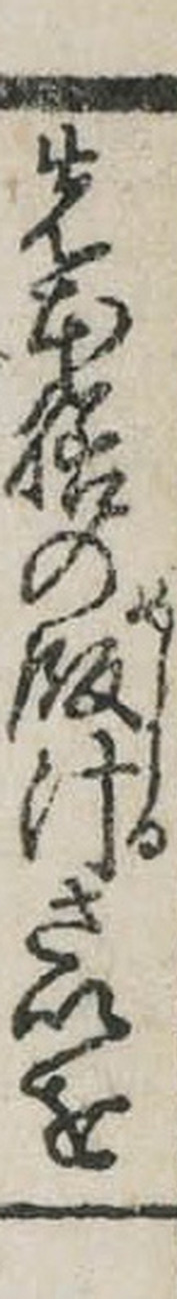先本膳の飯汁さいを
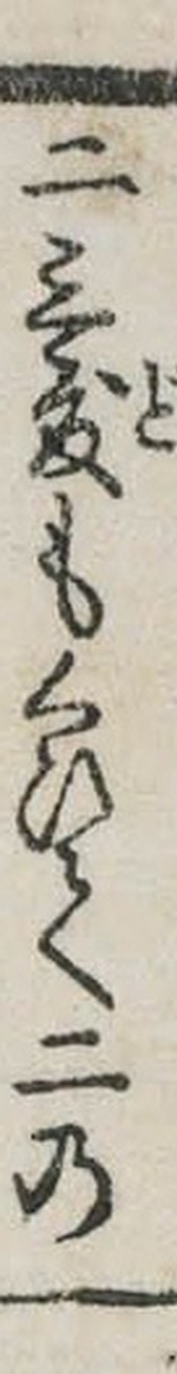二三度もくひて二の
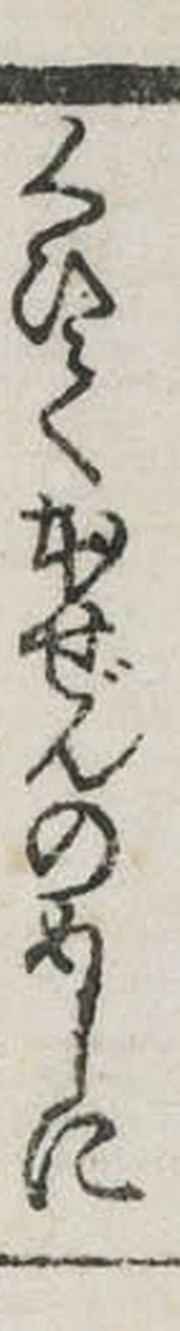くひて本ぜんのめしに
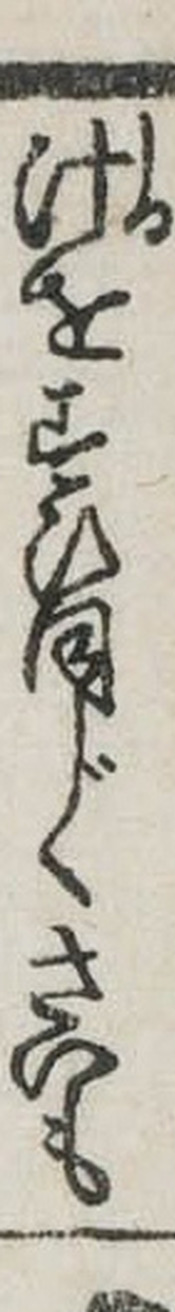汁をすひ同じくさいも
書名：頭書萬用婦人手紙之文言
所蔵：東京学芸大学教育コンテンツアーカイブ
